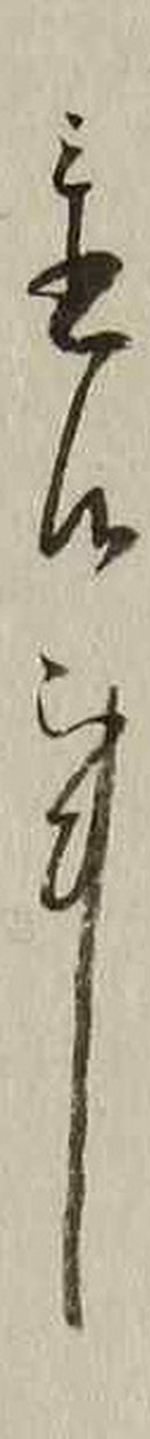置候事
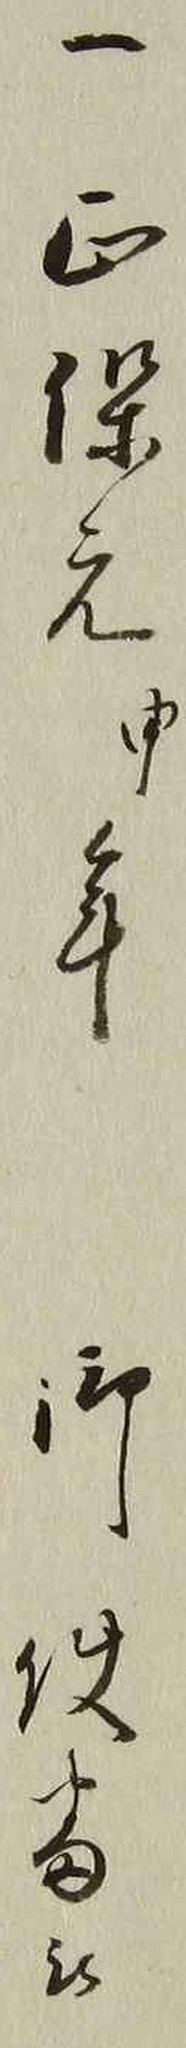一正保元申年御使番被
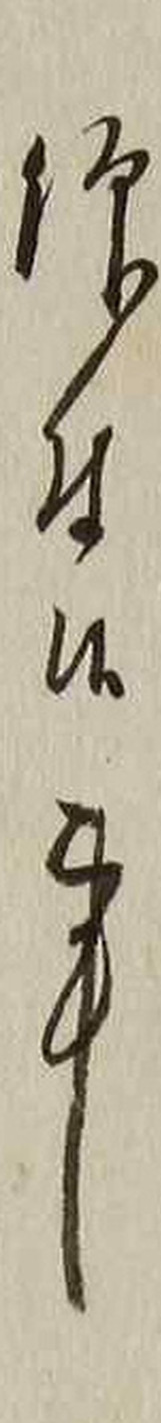仰付候事
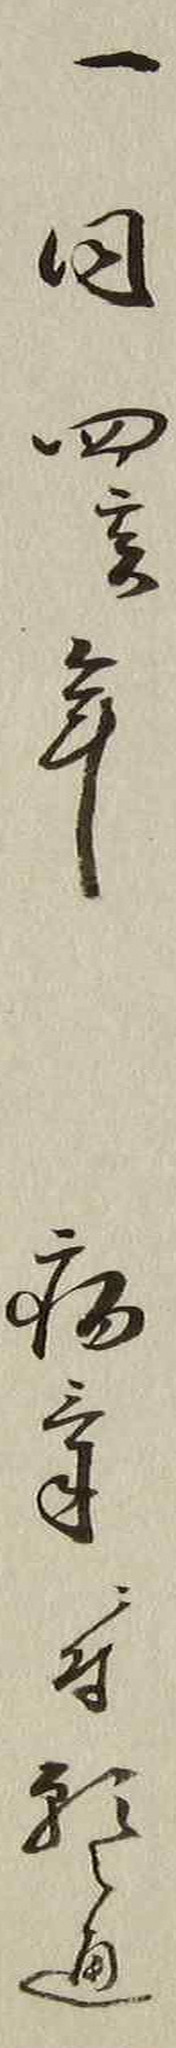一同四亥年病気に付願之通
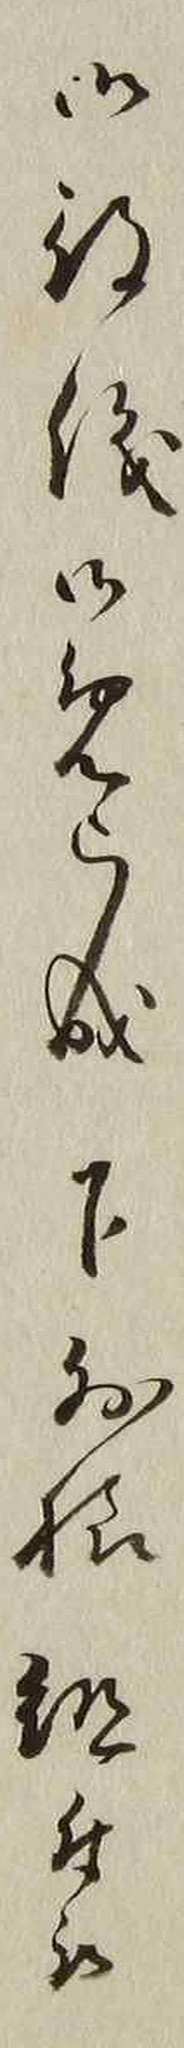御役儀御免被成下外様組付被
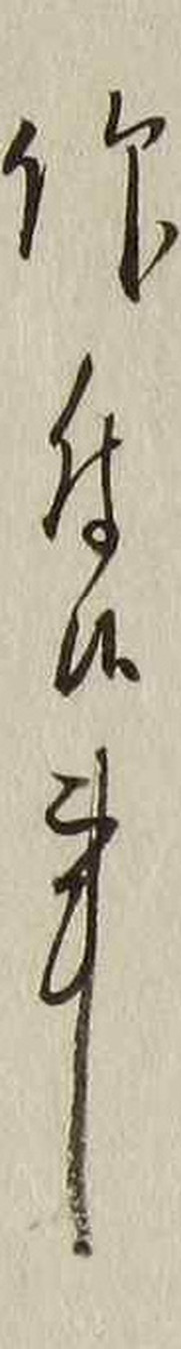仰付候事
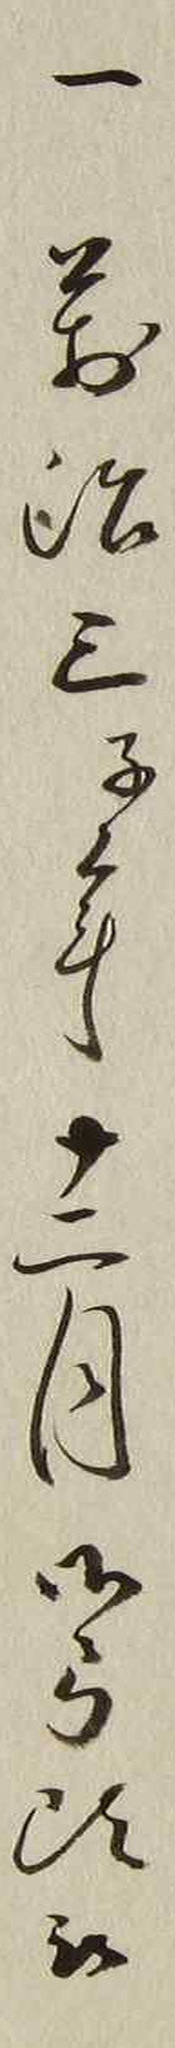一万治三子年十二月御弓頭被
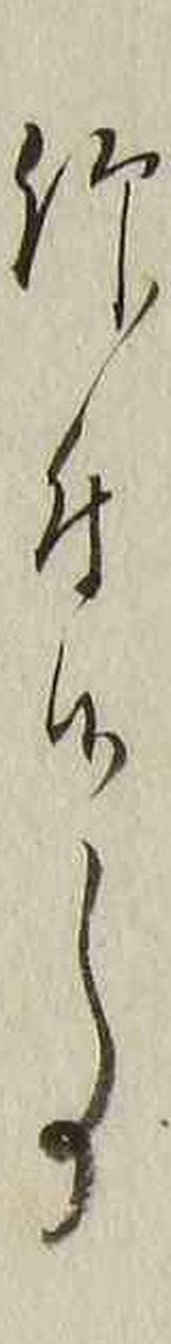仰付候事
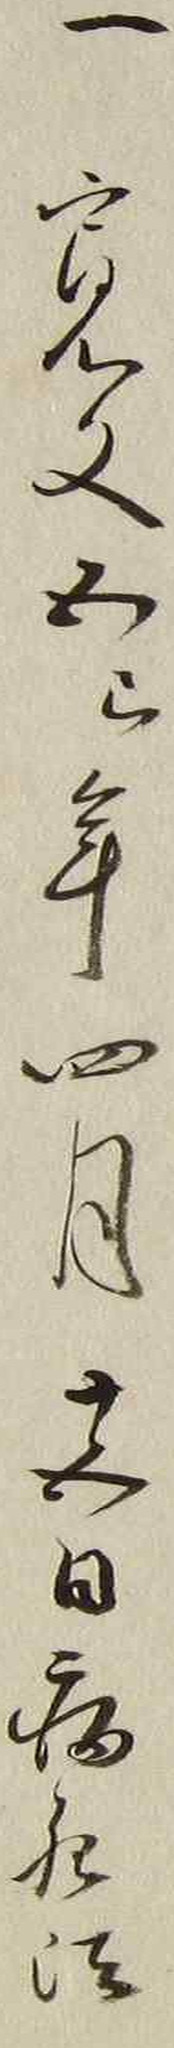一寛文五巳年四月十五日病死法
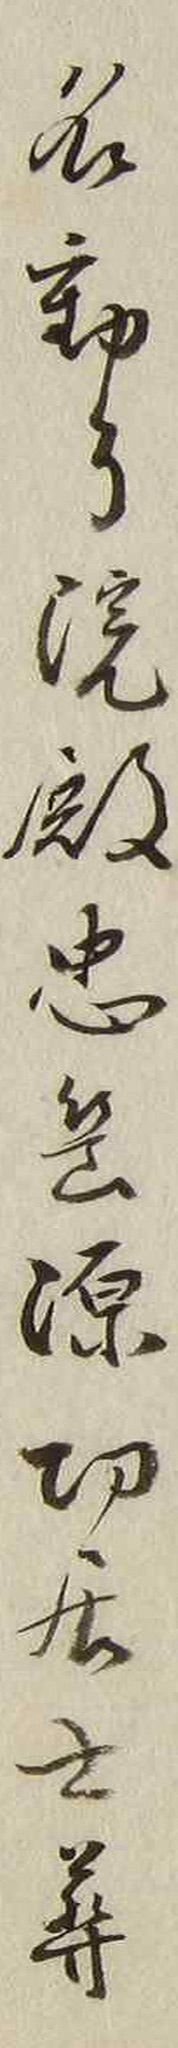名勤了院殿忠甚源切居士葬
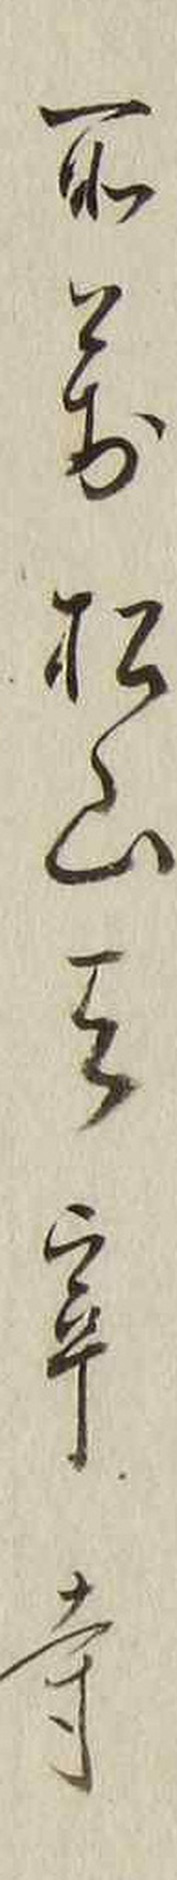所万松山天寧寺

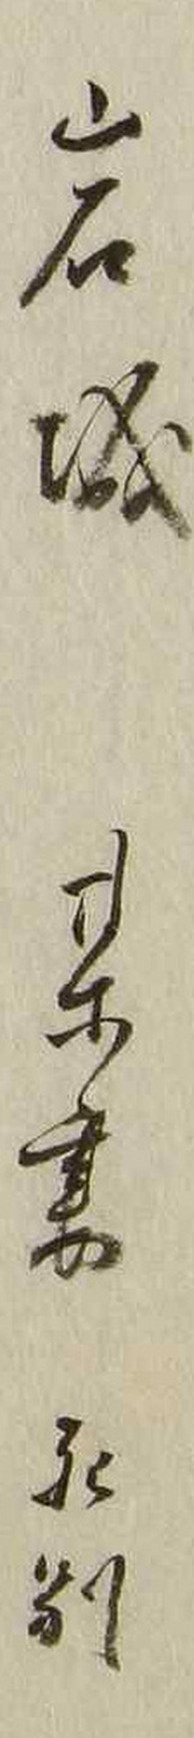女岩城某妻死別
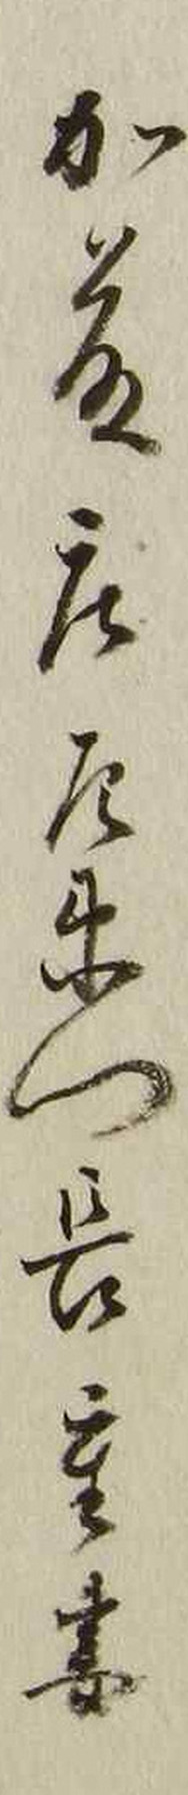加藤庄左衛門長重妻
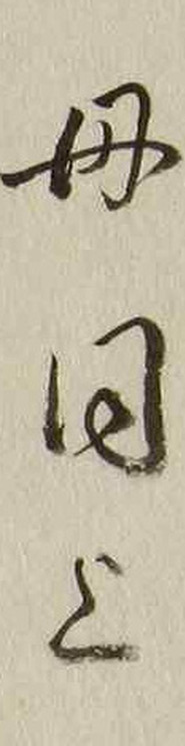母同上
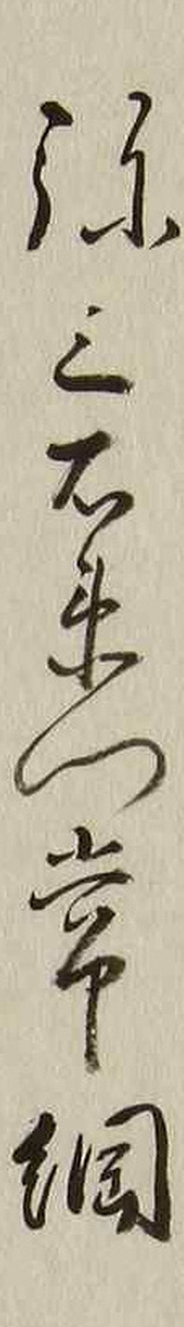弥三右衛門常綱
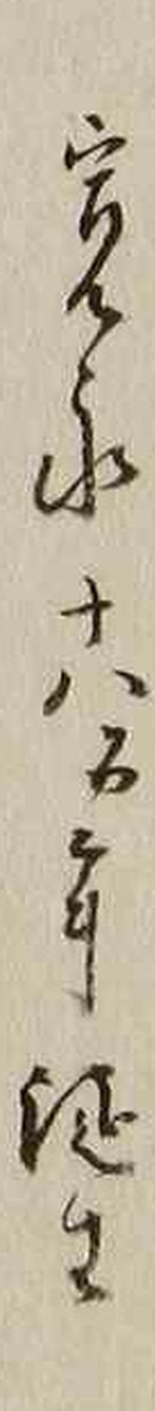寛永十八巳年誕生
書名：諸士系譜　巻之159　な之部1
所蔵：会津若松市立会津図書館
